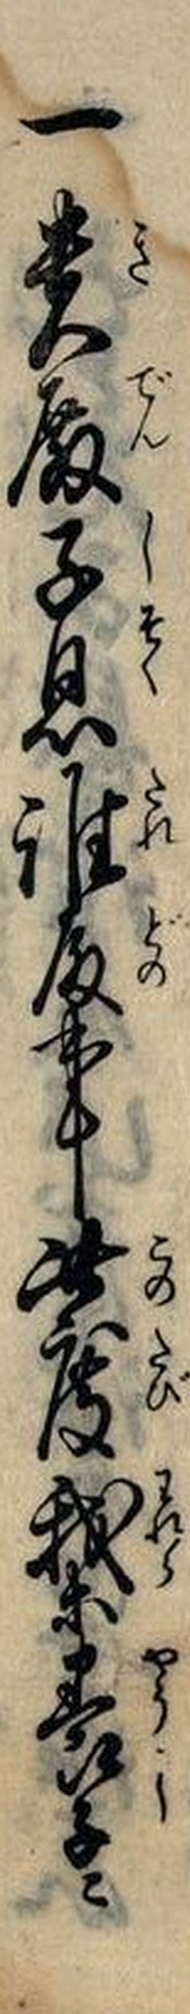一貴殿子息誰殿事此度我等養子に
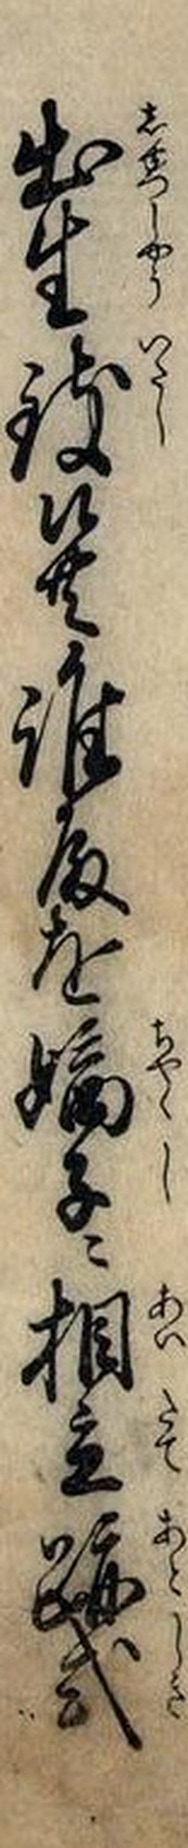出生致候共誰殿を嫡子に相立跡式
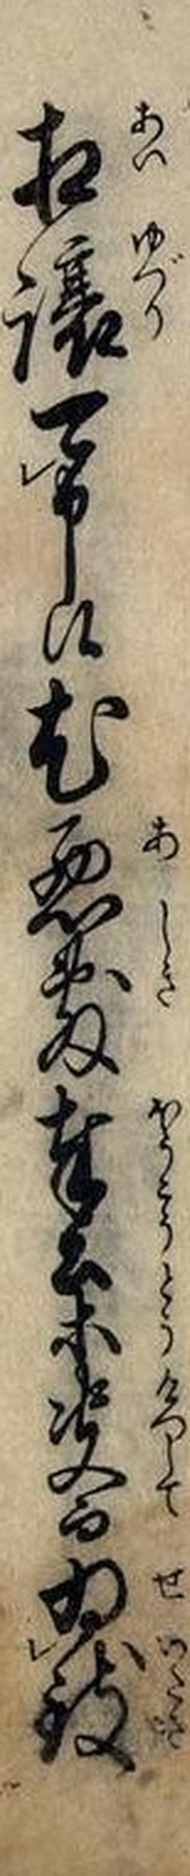相譲可申候尤悪敷奉公等決而為致
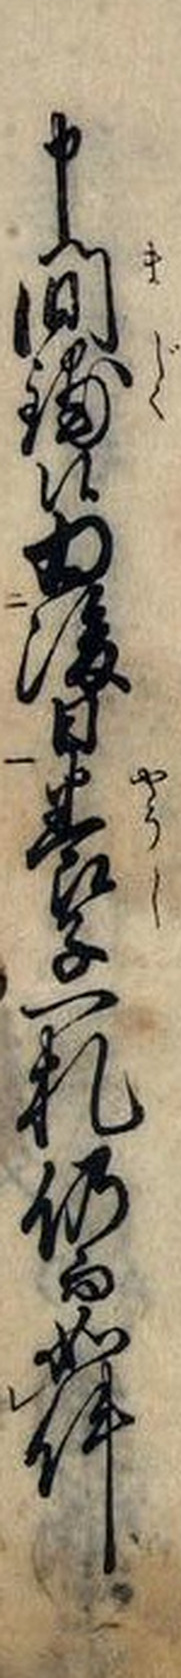申間舖候為後日養子一札仍而如件

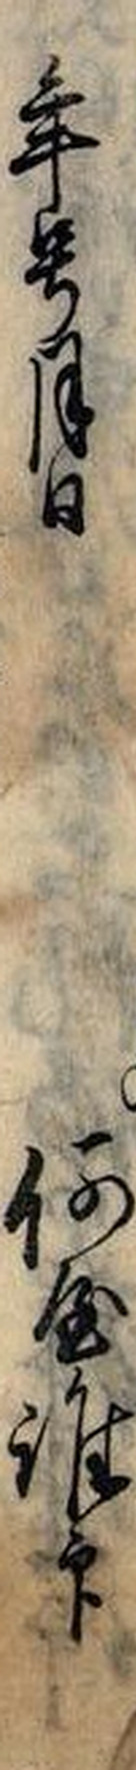年号月日何屋誰印
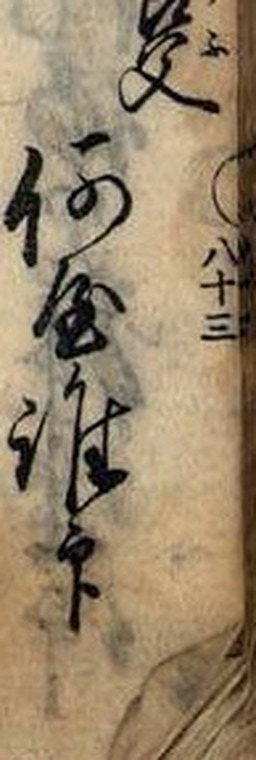何屋誰殿
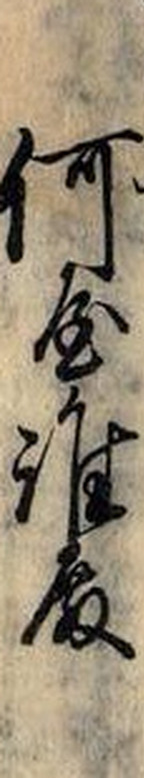何屋誰殿
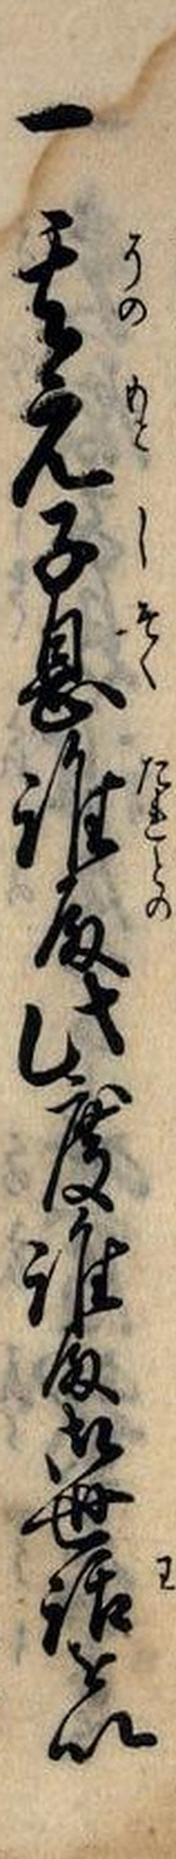一其元子息誰殿此度誰殿御世話を以
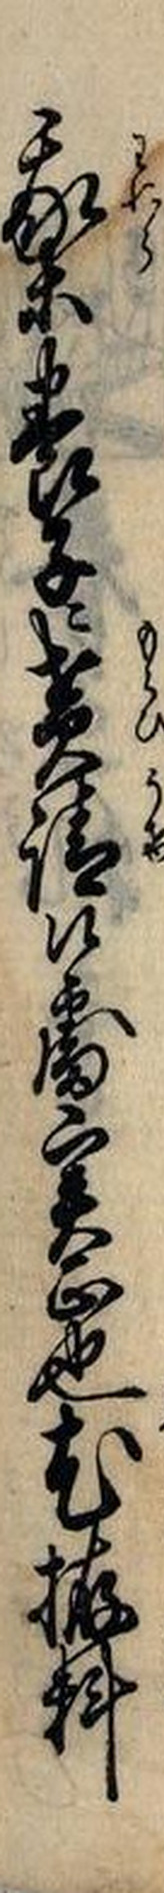我等養子に貰請候處実正也尤拵料
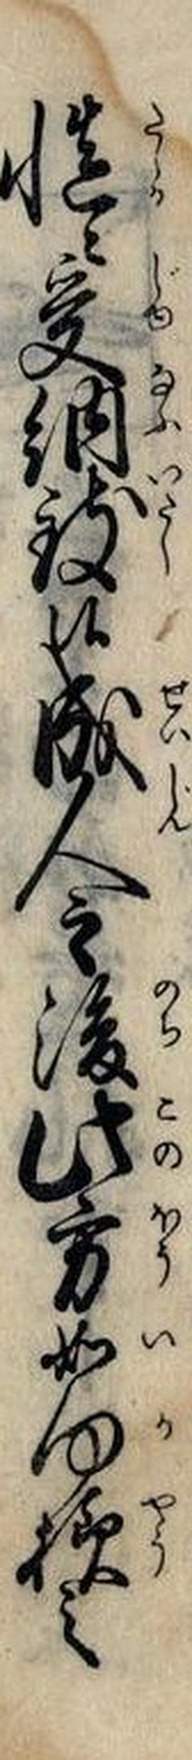慥に受納致候成人之後此方如何様之
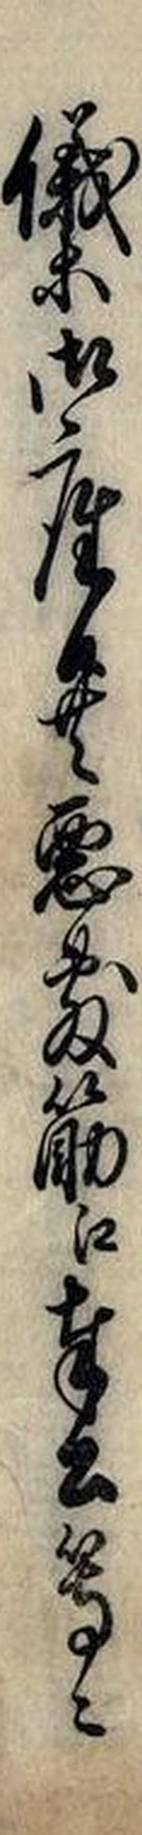儀等御座候共悪敷筋江奉公等に
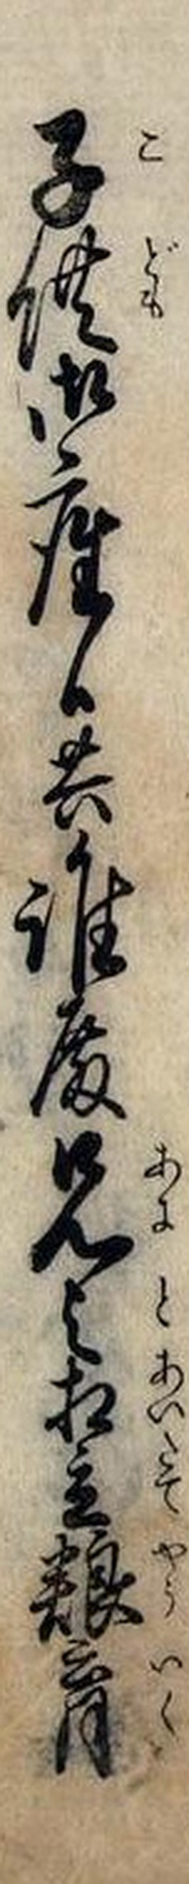子供御座候共誰殿兄与相立養育
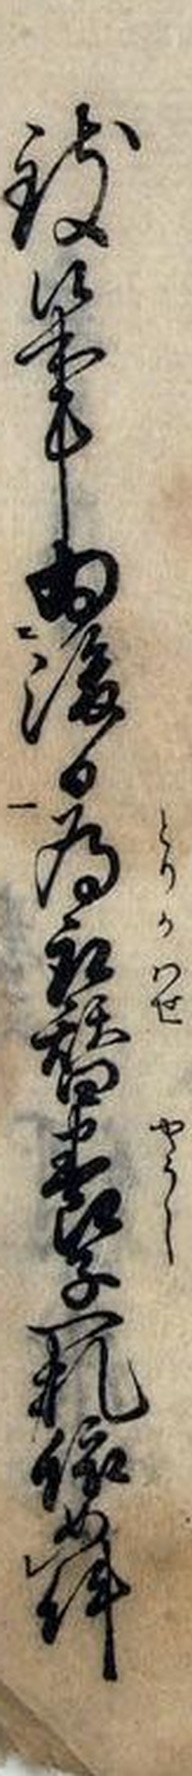致候事為後日為取替養子一札依如件

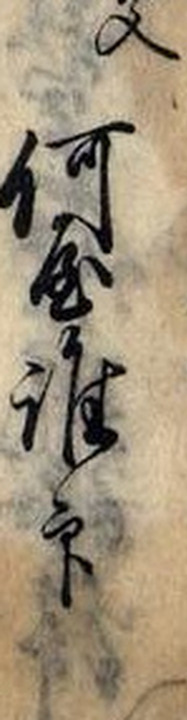何屋誰印
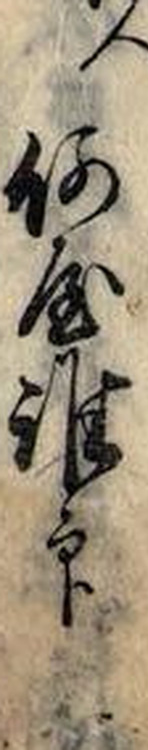何屋誰印
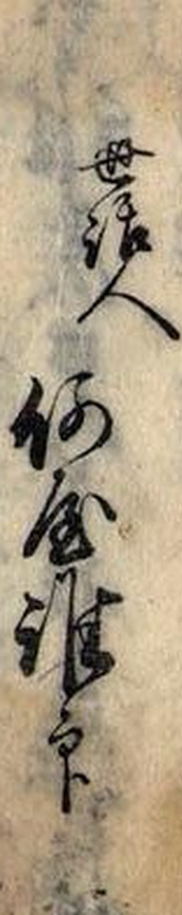何屋誰印
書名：大成用文章（往来物）
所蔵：福井県文書館 Fukui Prefectural Archives
